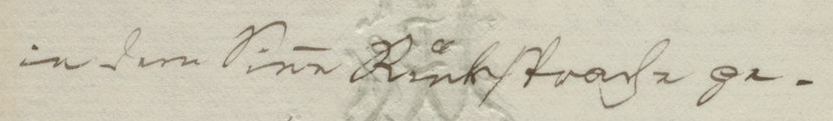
in dem Sinne Rücksprache ge-
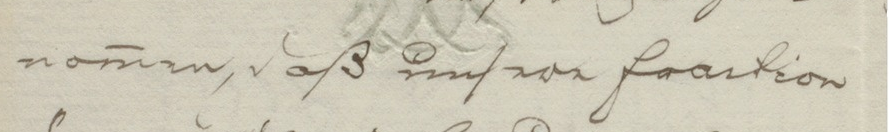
nommen, daß unsere Fraction
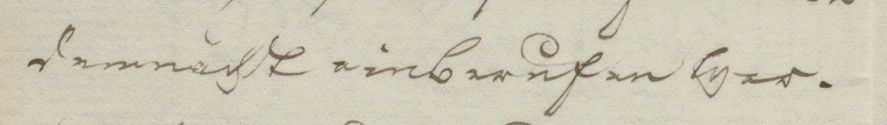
demnächst einberufen wer-
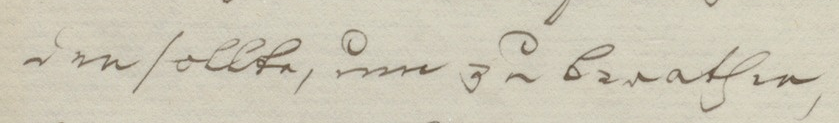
den sollte, um zu berathen,
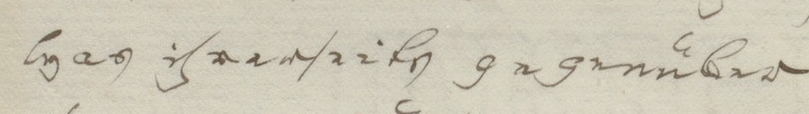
was ihrerseits gegenüber
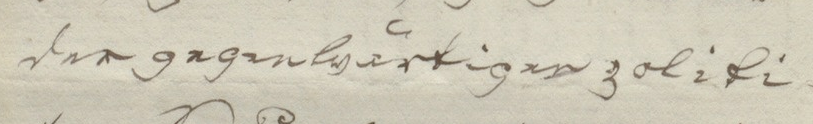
der gegenwärtigen politi-
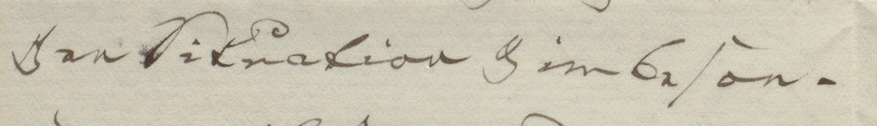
schen Situation & im beson-
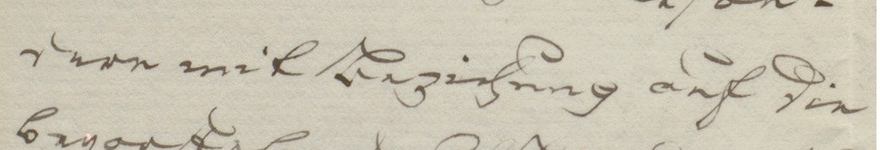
dern mit Beziehung auf die
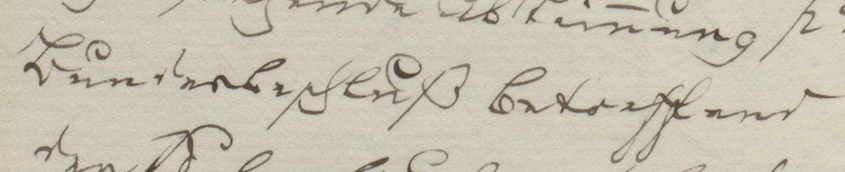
Bundesbeschluß betreffend
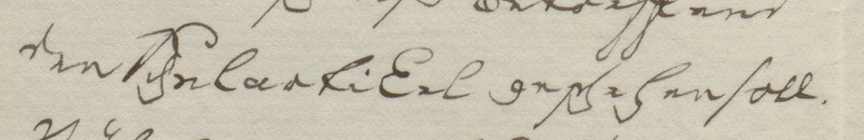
den Schulartikel geschehen soll.
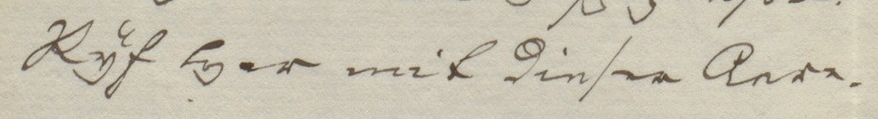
Ryf war mit dieser Anre-
